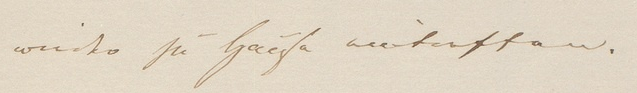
wieder zu Hause eintreffen.
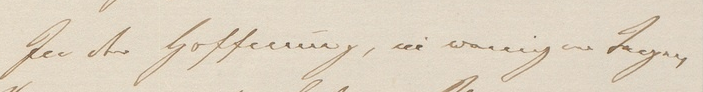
In der Hoffnung, in wenigen Tagen
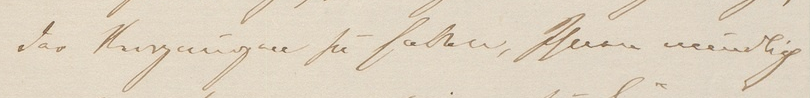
das Vergnügen zu haben, Ihnen mündlich
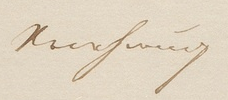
Verehrung
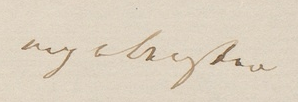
ergebenster
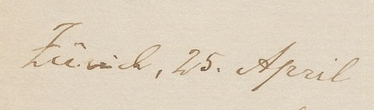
Zürich, 25. April
